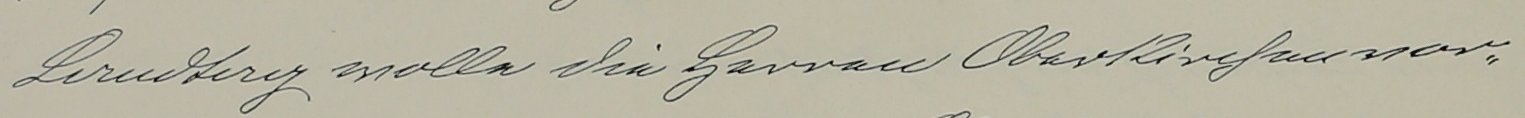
Landtag wolle die Herren Oberkirchenvor-
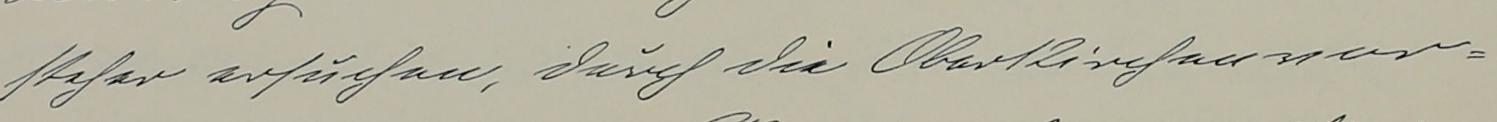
steher ersuchen, durch die Oberkirchenvor-
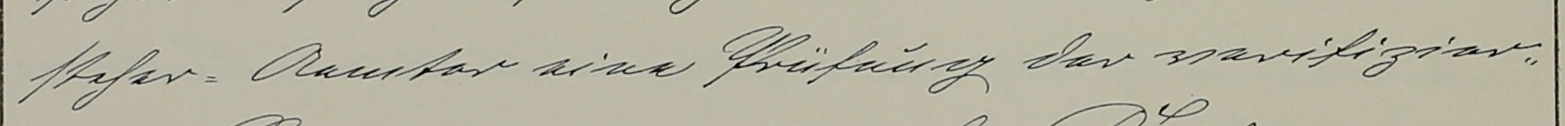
steher-Aemter eine Prüfung der verifizier-
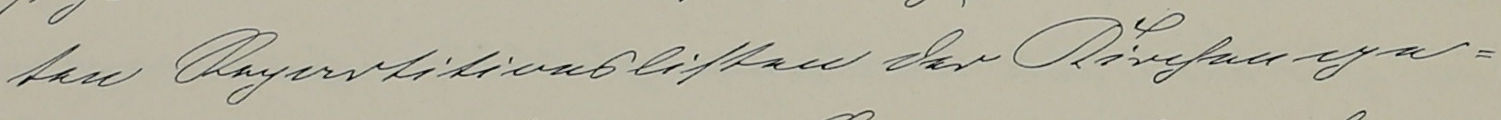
ten Repartitionslisten der Kirchenge-
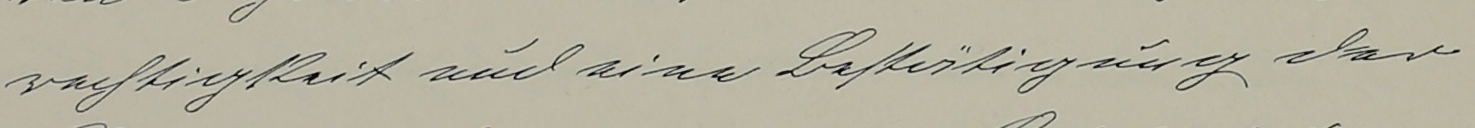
rechtigkeit und eine Bestätigung der
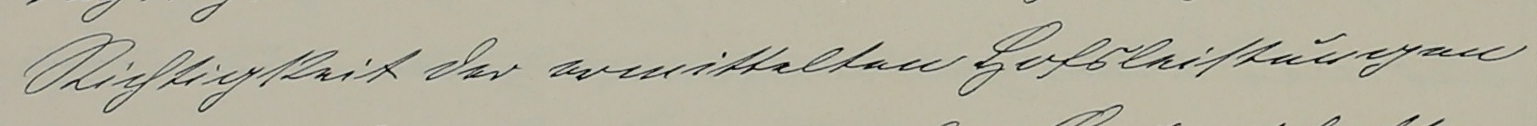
Richtigkeit der ermittelten Hofsleistungen
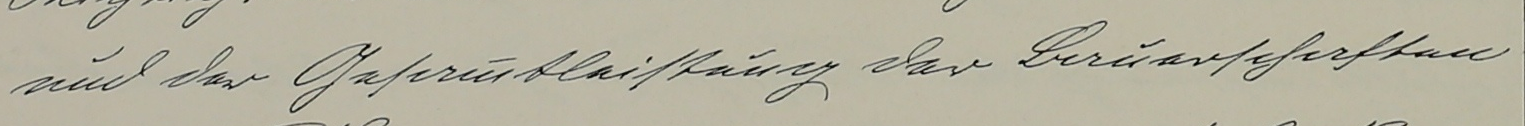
und der Gesammtleistung der Bauerschaften
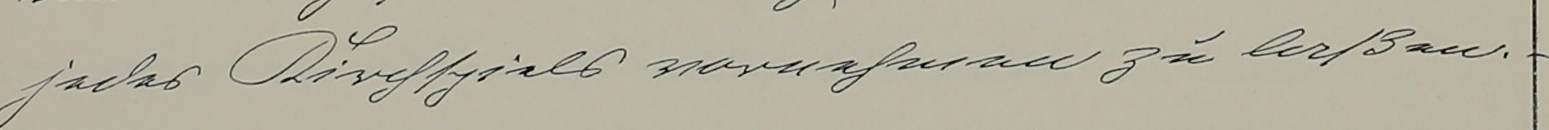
jedes Kirchspiels vornehmen zu laßen.
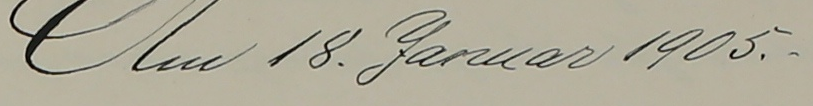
Am 18. Januar 1905.
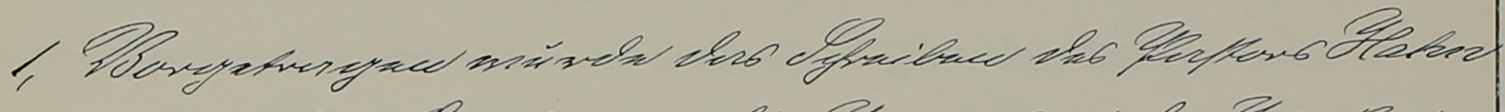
1. Vorgetragen wurde das Schreiben des Pastors Hahn
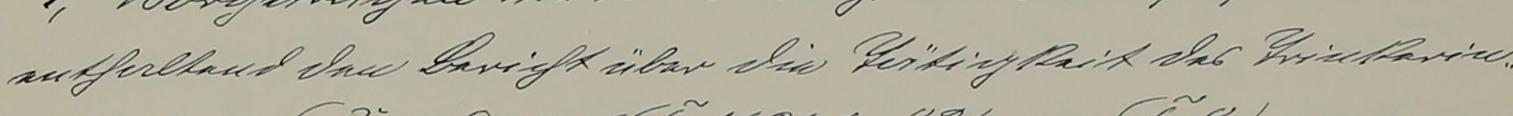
enthaltend den Bericht über die Tätigkeit des Trinkerin-
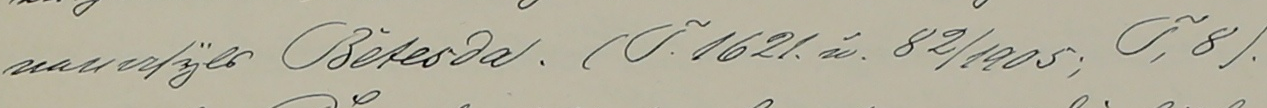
nenasyls Betesda. (T.1621 u. 82/1905; T.8).
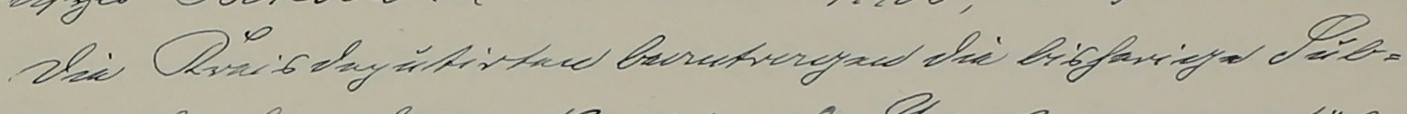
Die Kreisdeputirten beantragen die bisherige Sub-
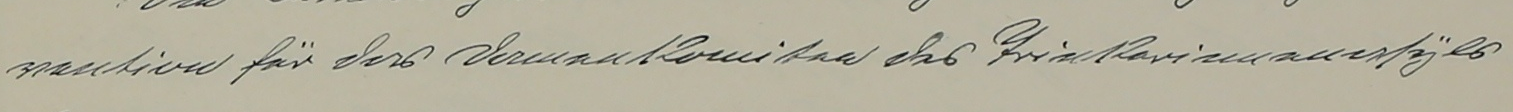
vention für das Damenkomitee des Trinkerinnenasyls
